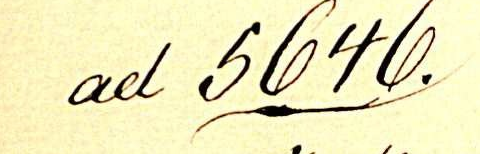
ad 5646/
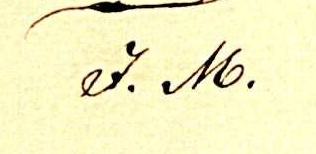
J.M.
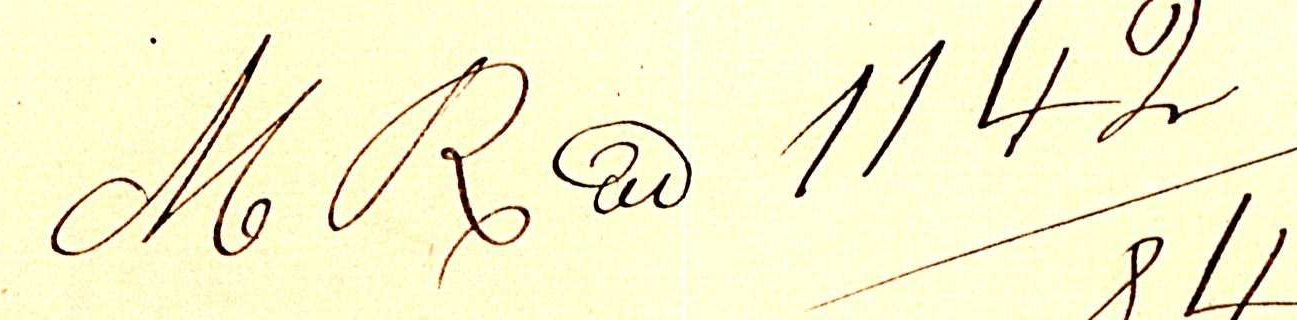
MR ad 1142/
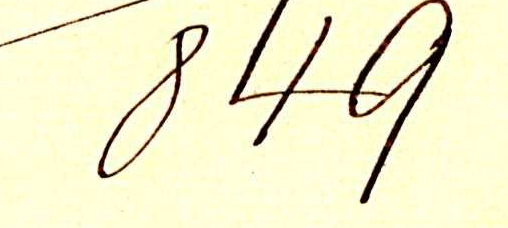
849
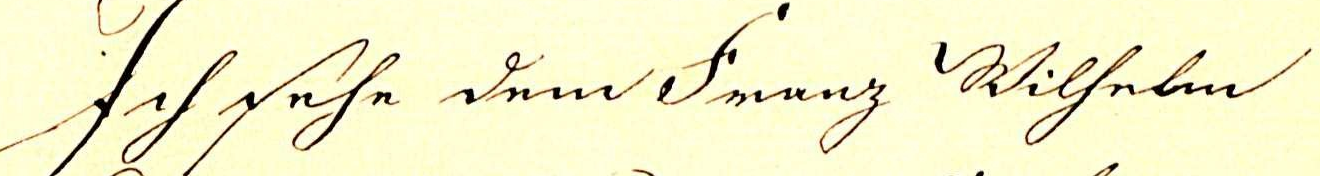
Ich sehe dem Franz Wilhelm
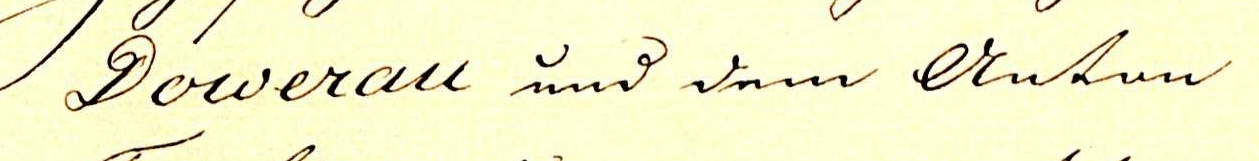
Dowerau und dem Anton
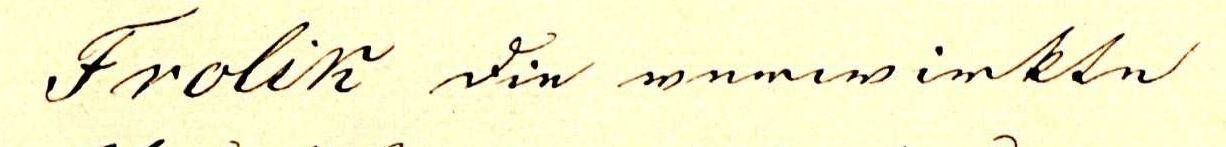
Frolik die verwirkte
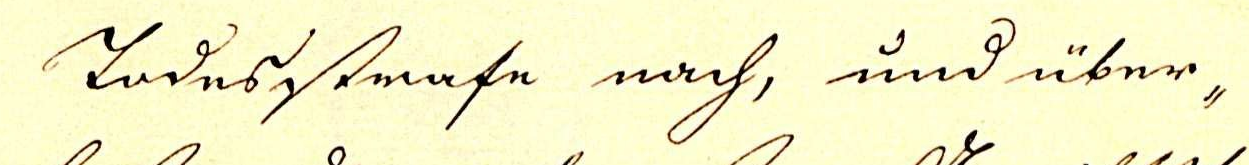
Todesstrafe nach, und über¬
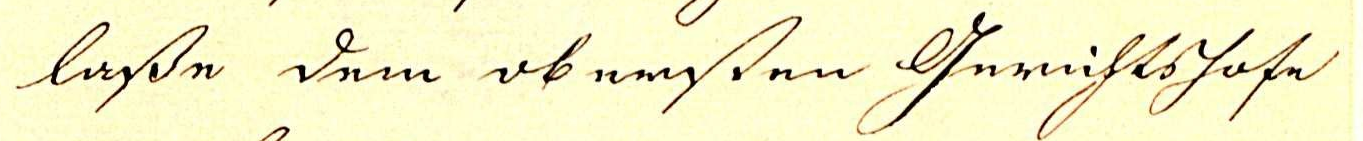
lasse dem obersten Gerichtshofe
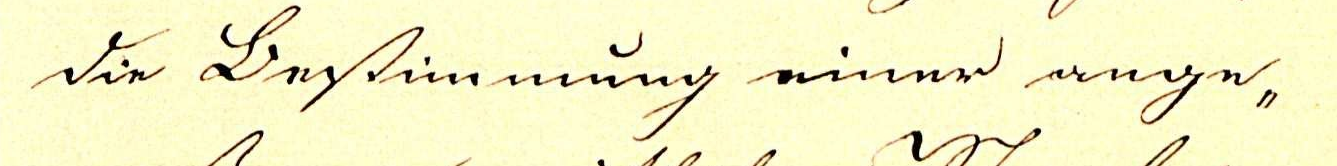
die Bestimmung einer ange¬
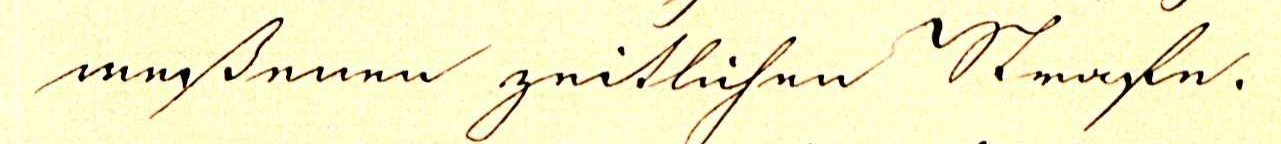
meßenen zeitlichen Strafe.
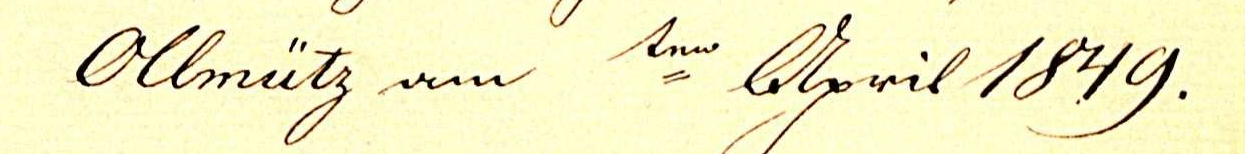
Ollmütz, am ten April 1849
